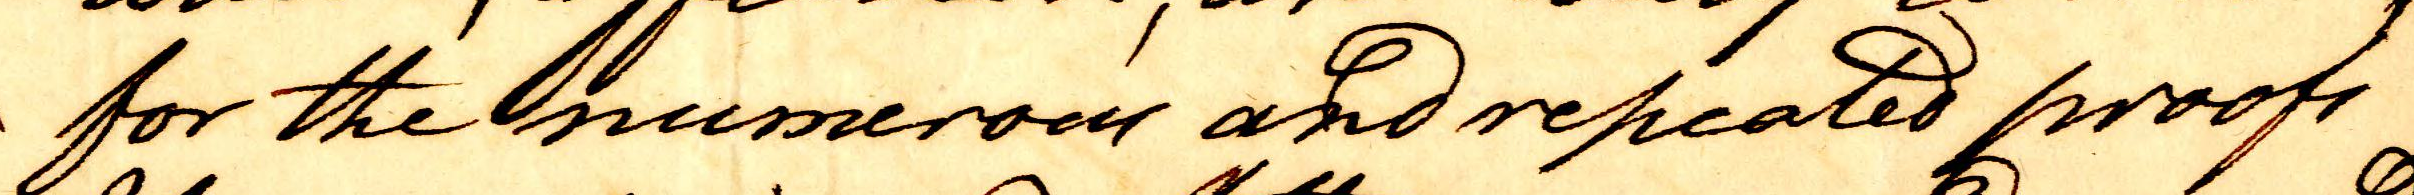for the numerous and repeated proofs
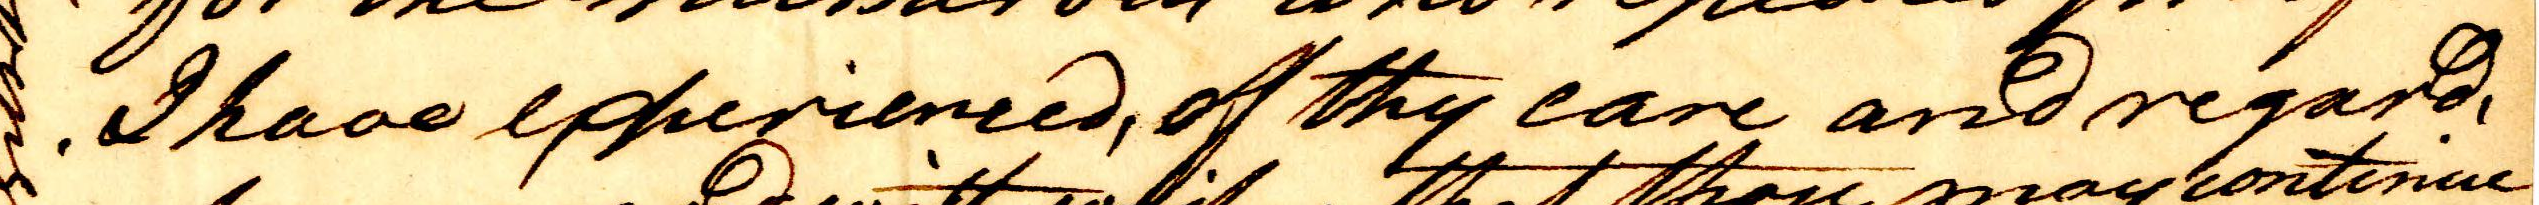I have experienced, of thy care and regard,
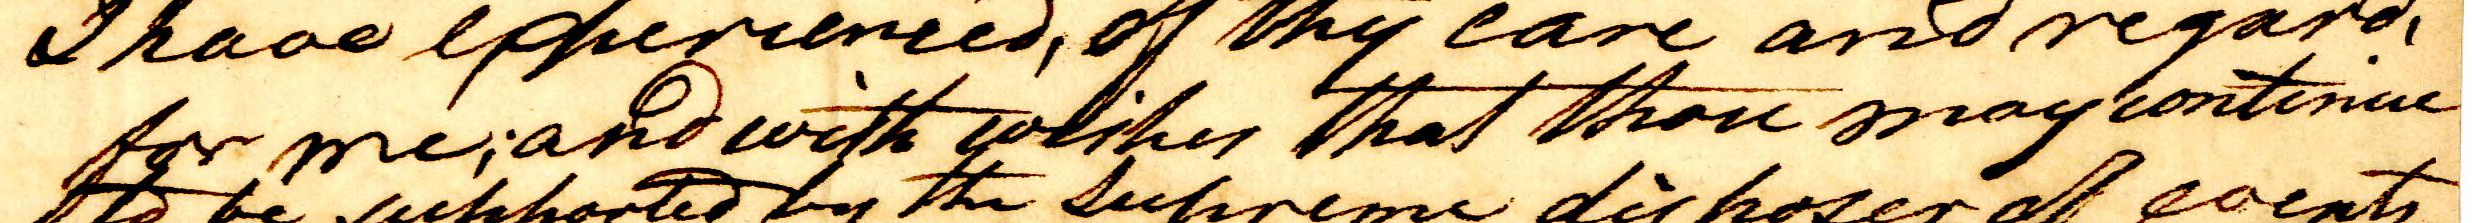for me; and with wishes that thou may continue
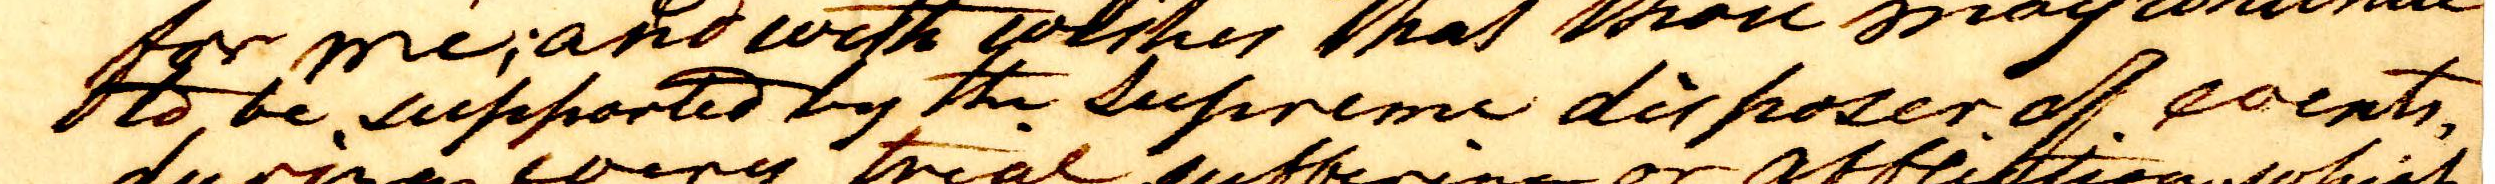to be supported by the supreme disposer of events,
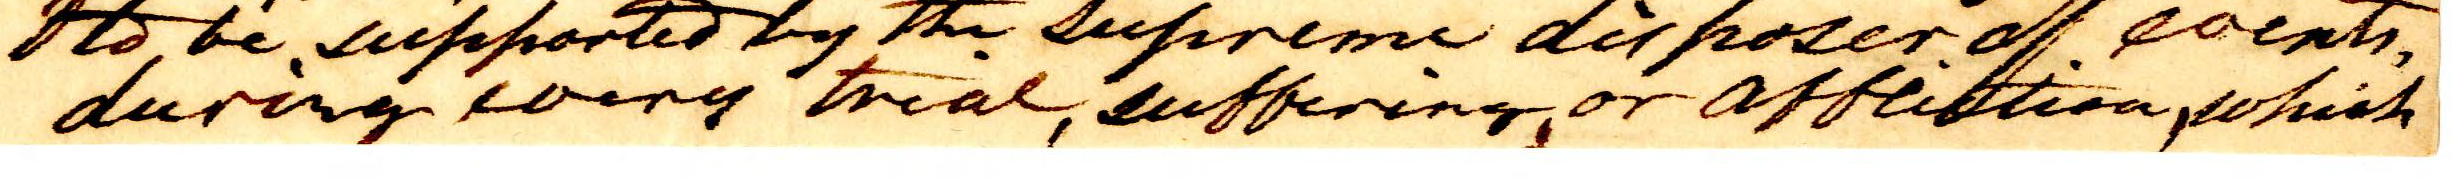during every trial, suffering, or affliction, which
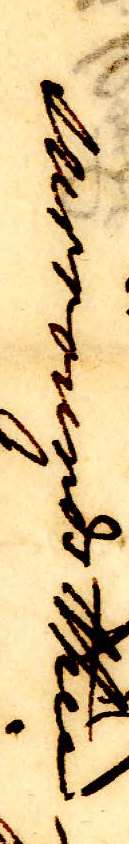surrounds thee
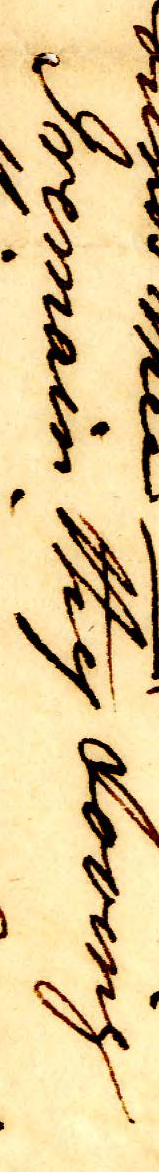I remain thy Loving
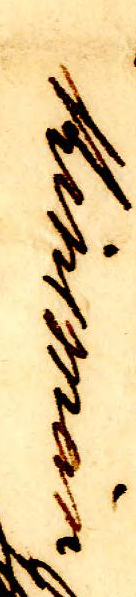Kinsman
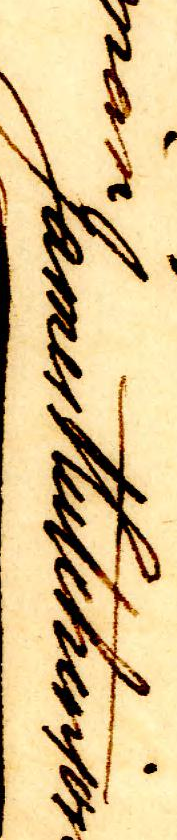James Hutchinson
